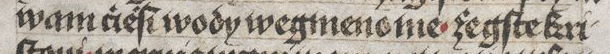wam ċieẛi wody wegme me.że gſte kri¬
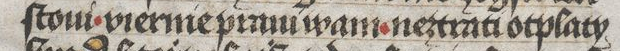ſtoui.vernie prauui wam.neztrati otplaty
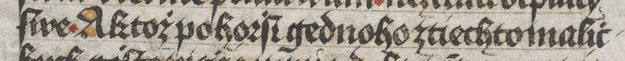ſwe.A ktoż pohorẛi gednoho ztíechto maliċ¬
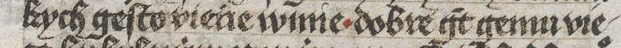kych geẛto vieċíe vmie.dobre ḡt gemu víe¬
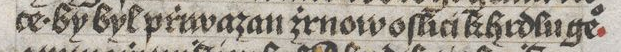te.by byl pṙiwazan żrnow oſlicí k hrdlu geo.
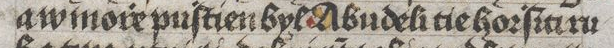a w moṙe puẛtíen byl.A budeli tíe horẛiti ru¬
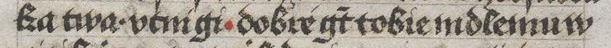ka twa.vtni gi. dobré ḡt tobie mdlemu w¬
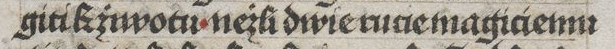giti k żiwotu.neżli dwie rucie magicíemu
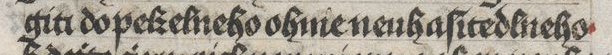gíti dopekelneho ohníe neuhaſitedlneho.
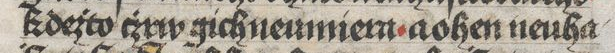kdeżto cżrw gich neumíera. a ohen neuha¬
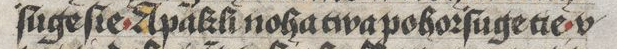ẛuge ſie. A pakli noha twa pohorſuge tie.v
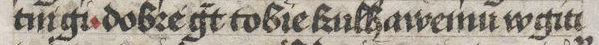tni gí. dobré ḡt tobie kulhavemu wgíti
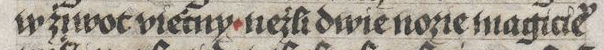w.żiwot vieċny.neżli dwie nozíe magiciev
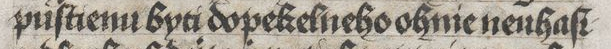puẛtienu byti do pekelneho ohnie neuhaſi¬
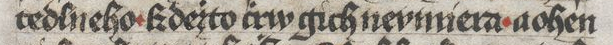tedlneho. kdeżto ċrw gich nevmíera.a ohen
